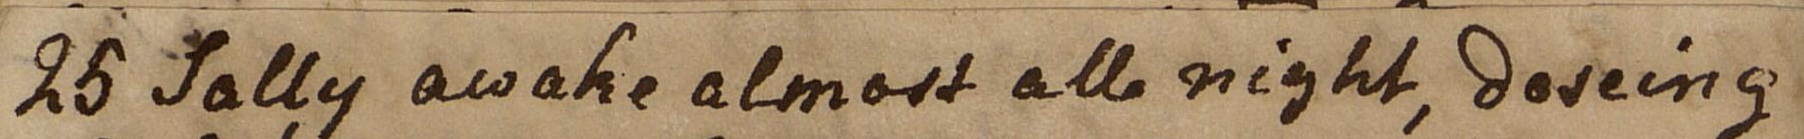25 Sally awake almost all night, doseing
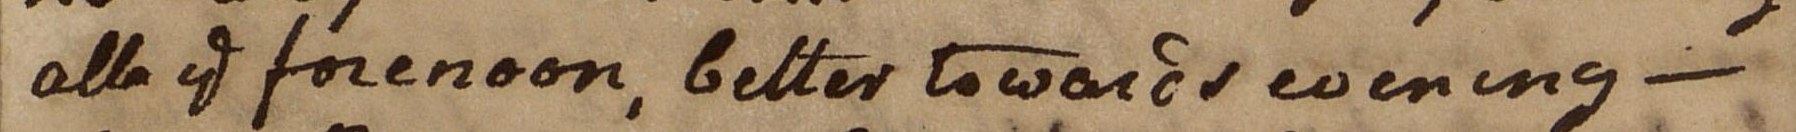all y^e forenoon, better towards evening-
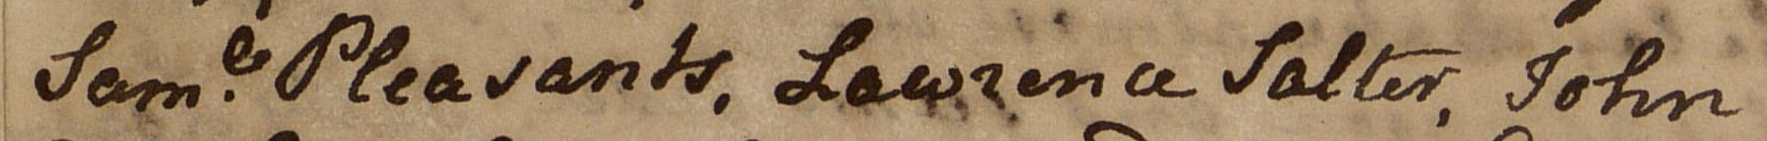Sam^l. Pleasants, Lawrence Salter, John
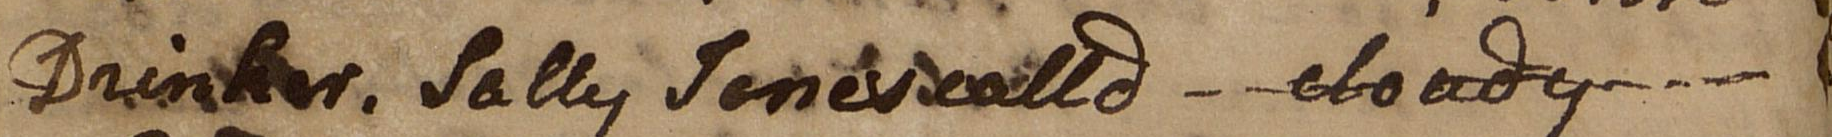Drinker. Sally Jones calld--cloudy--
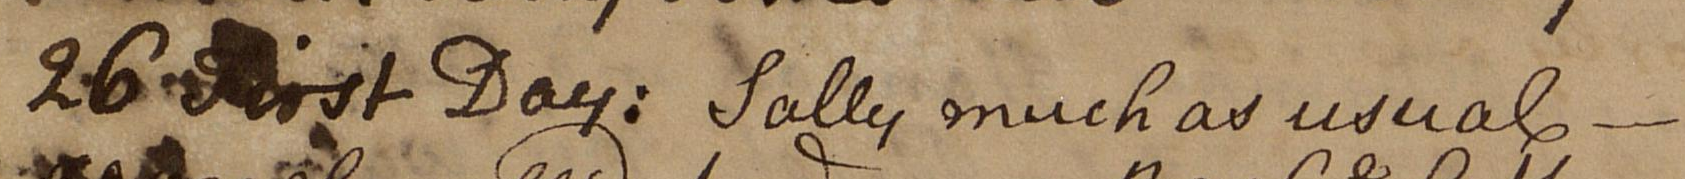26 First Day: Sally much as usual-
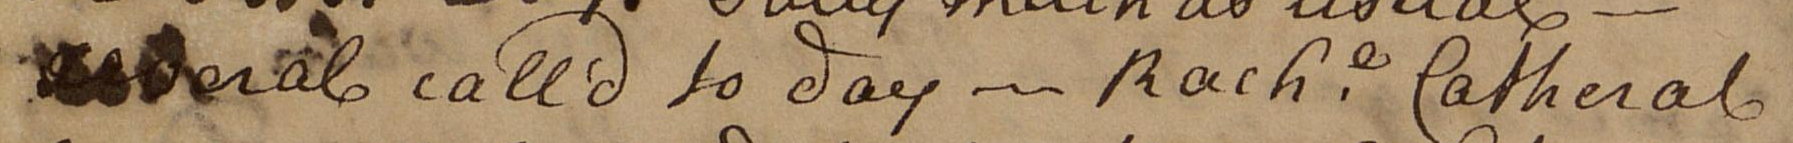several call'd to day- Rach^l Catheral
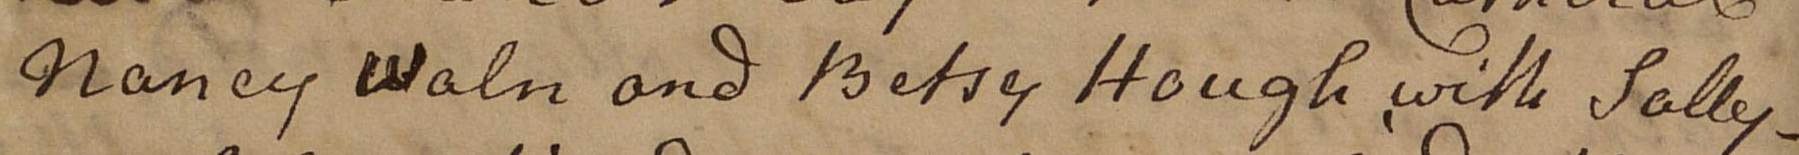Nancy Waln and Betsy Hough with Sally-
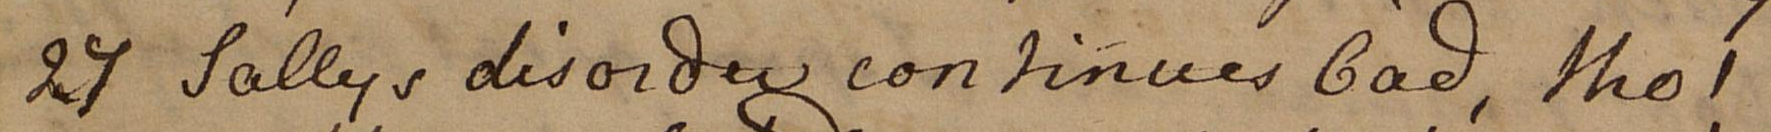27 Sallys disorder continues bad, tho'
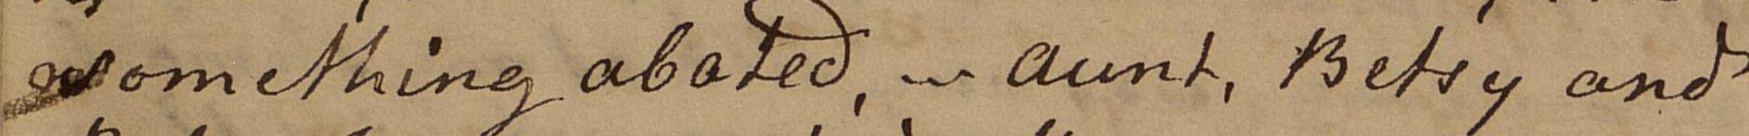something abated.- Aunt, Betsy and
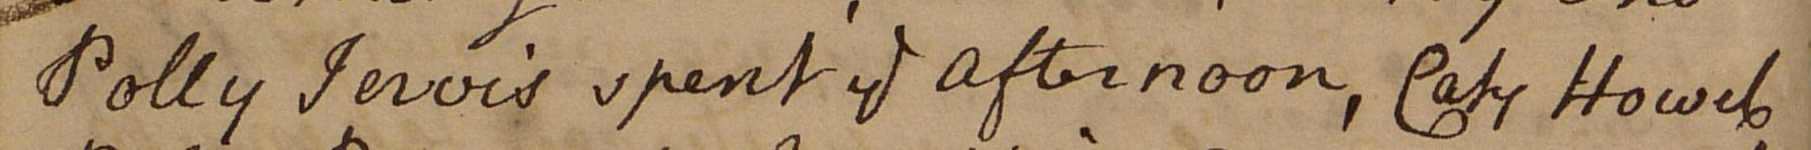Polly Jervis spent y^e afternoon, Caty Howel
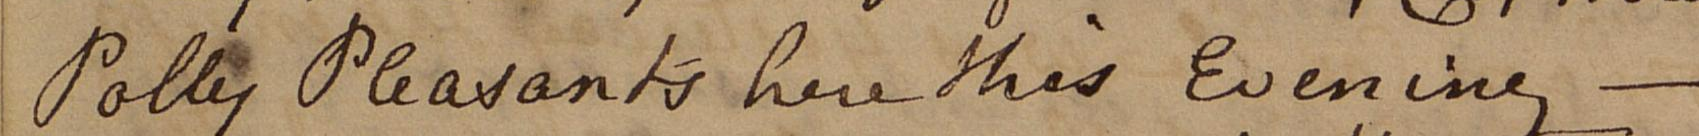Polly Pleasants here this Evening-
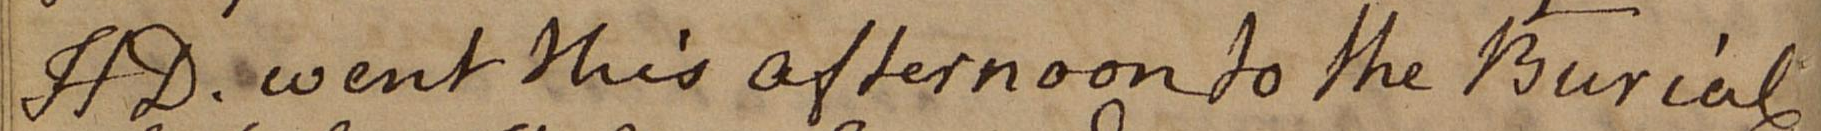HD: went this afternoon to the Burial
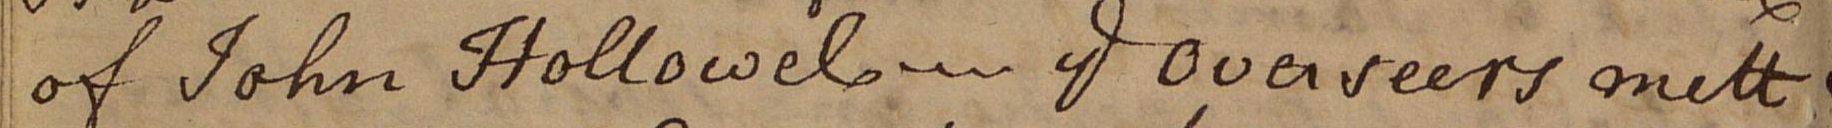of John Hollowel- y^e overseers mett
